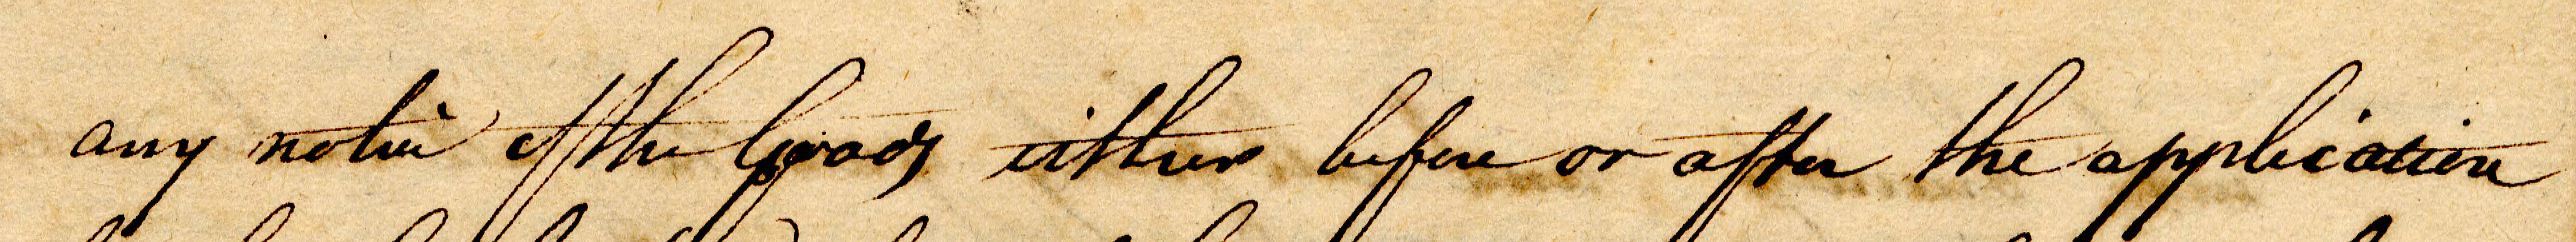any notice of the Goods either before or after the application
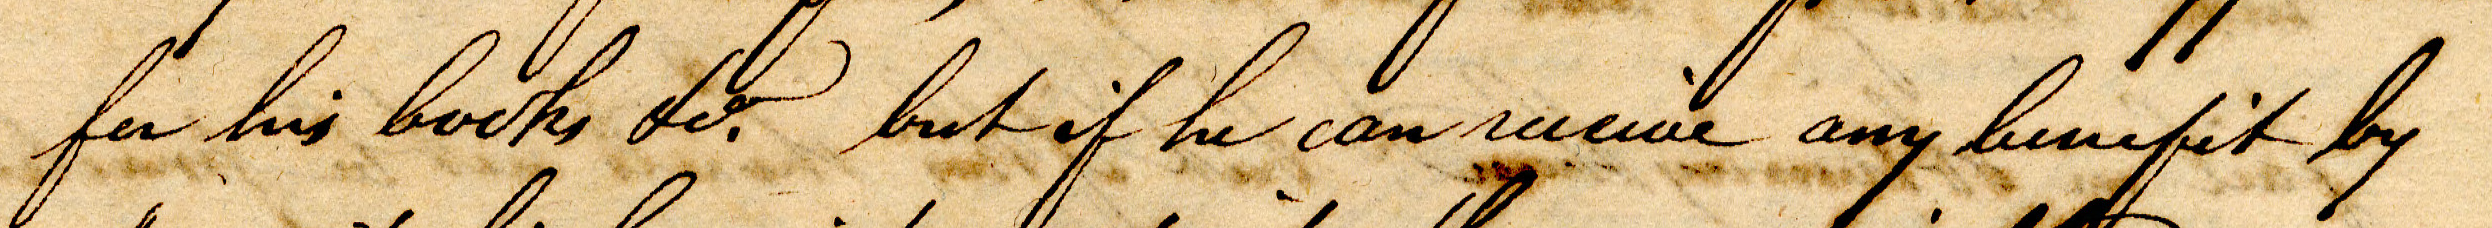for his books &c^a. but if he can receive any benefit by
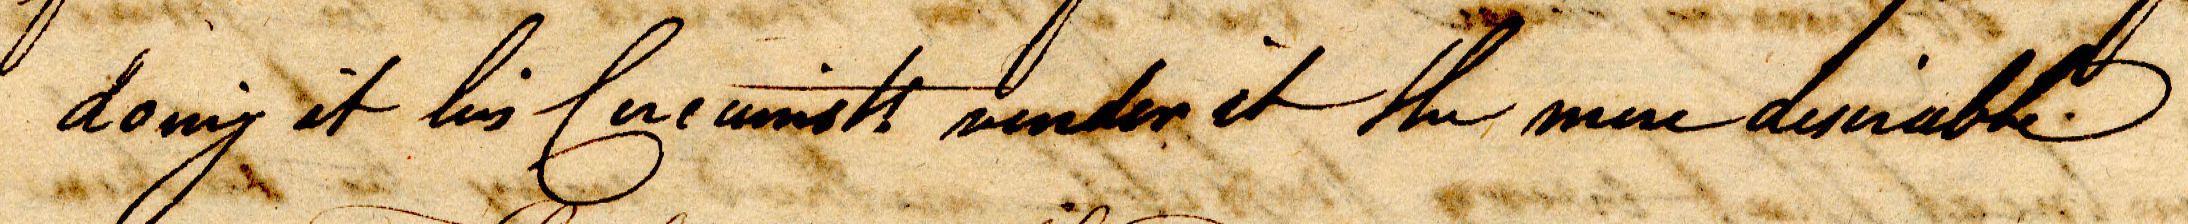doing it his Circumst^s. render it the more desirable.
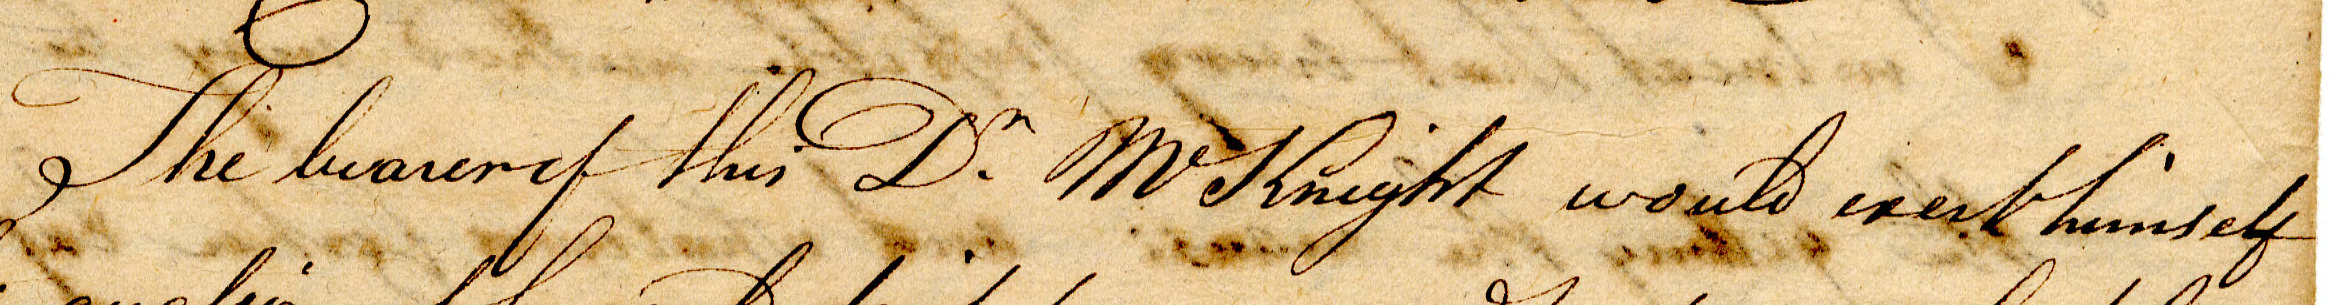The bearer of this D^r. M^cKnight would exert himself
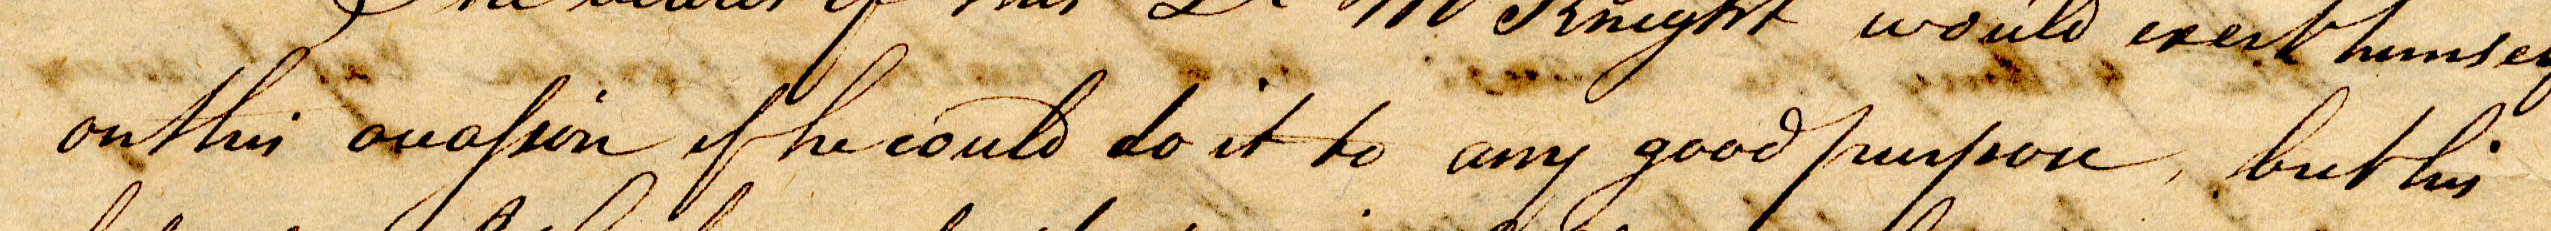on this occasion if he could do it to any good purpose, but his
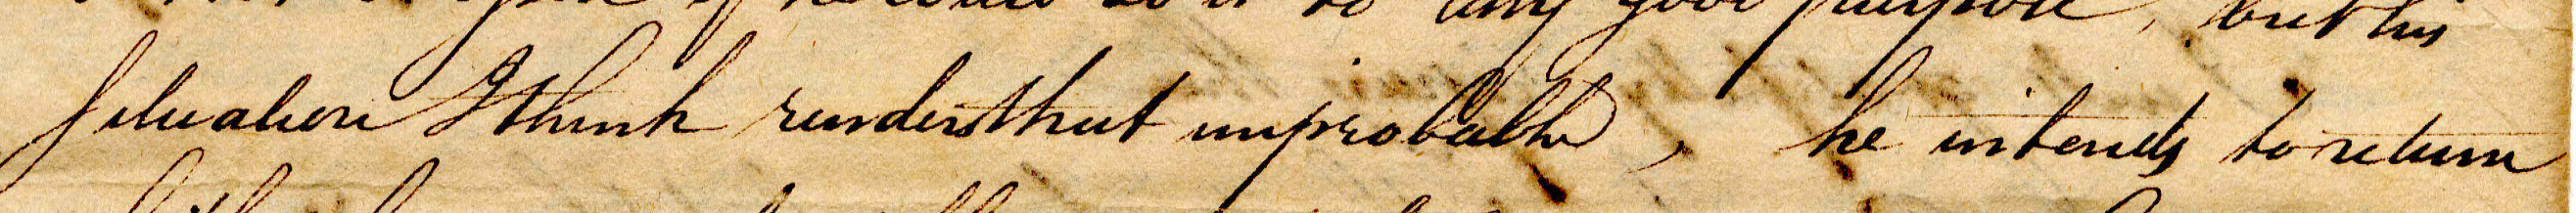situation I think renders that improbable, he intends to return
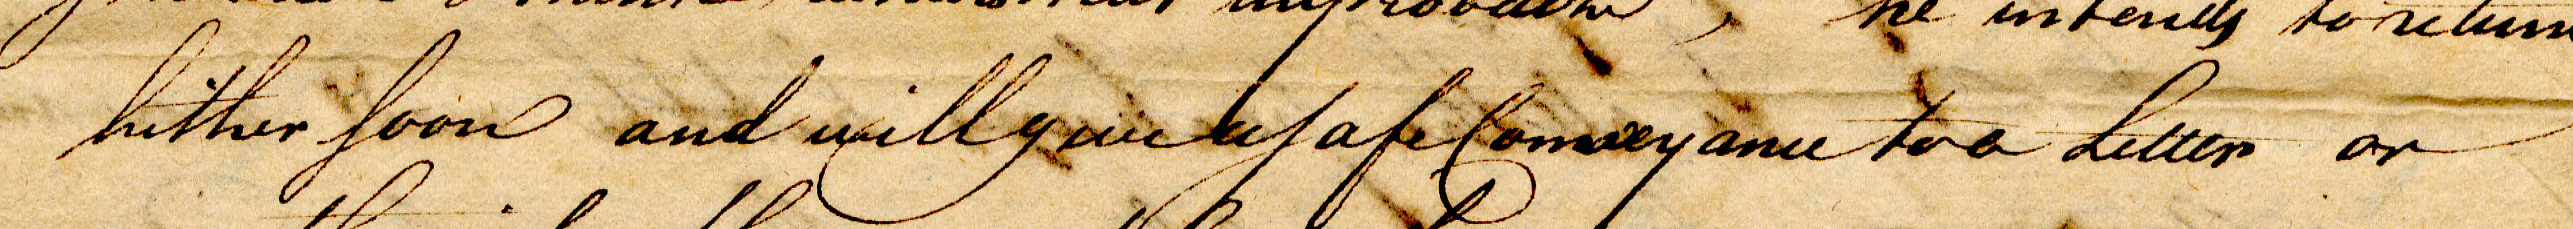hither soon and will give a safe Conveyance to a Letter or
